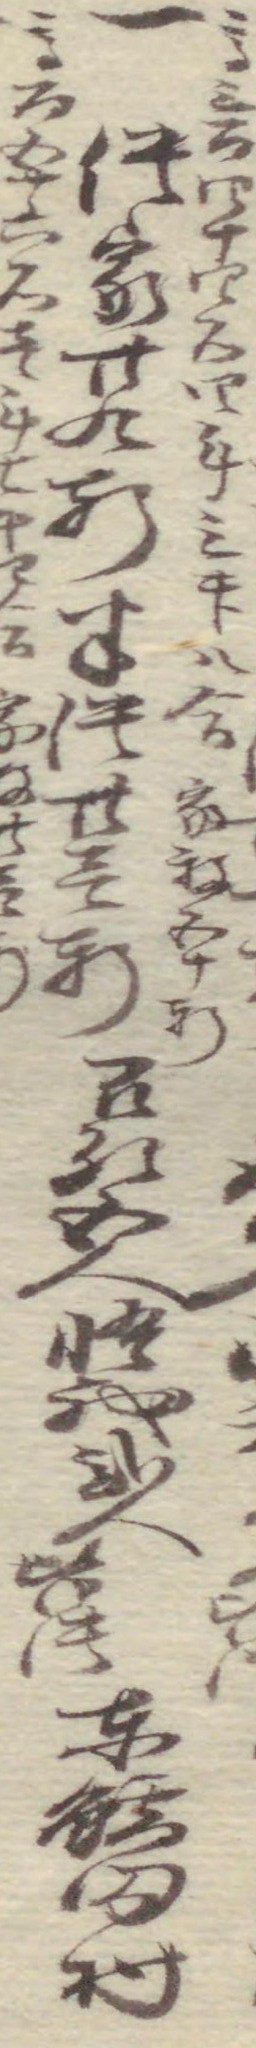一潰家廿九軒半潰廿壱軒即死五人怪我弐人皆潰東鱈田村
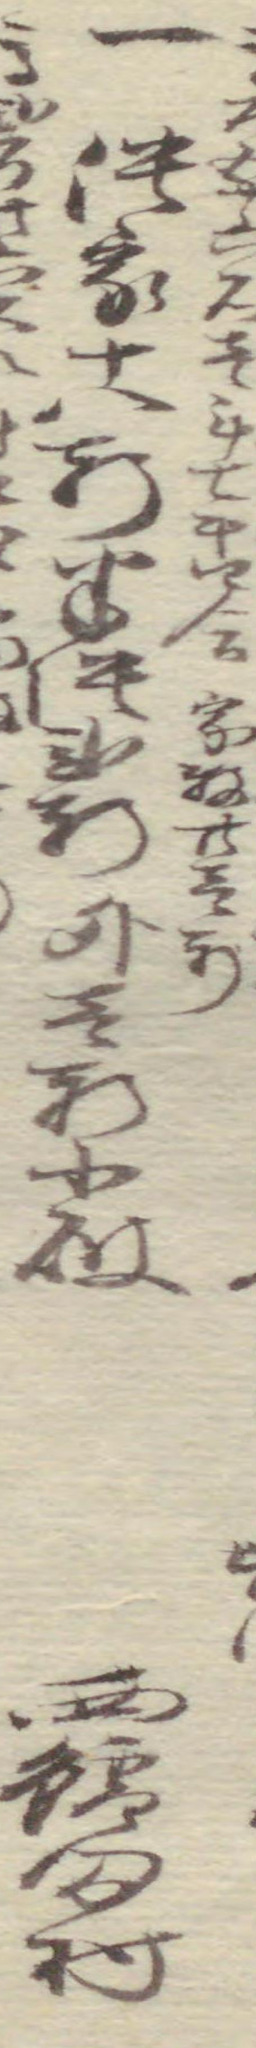一潰家十八軒半潰弐軒外壱軒小破西鱈田村
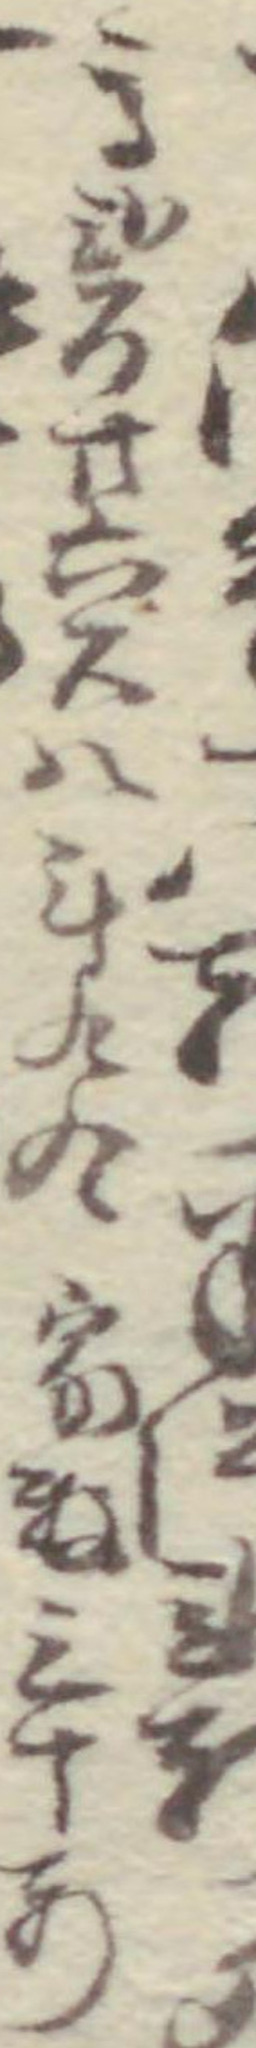高弐百廿六石八斗九合家数三十軒
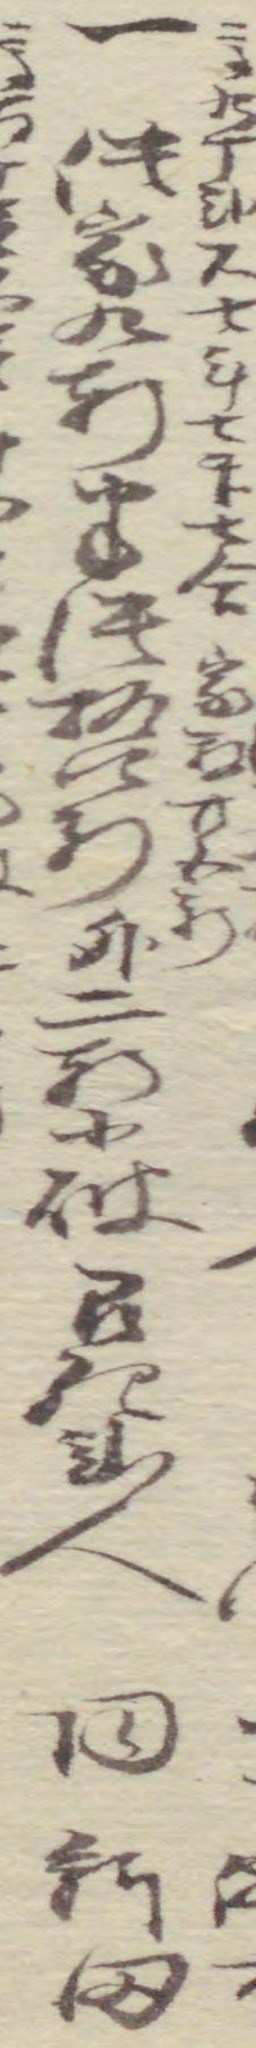一潰家九軒半潰拾四軒外二軒小破即死弐人同新田
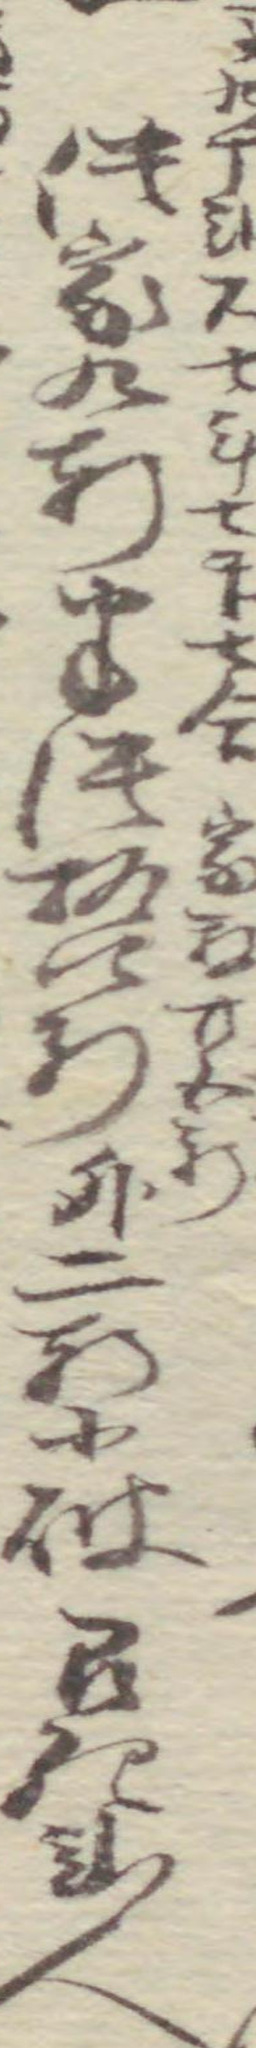一潰家九軒半潰拾四軒外二軒小破即死弐人同新田
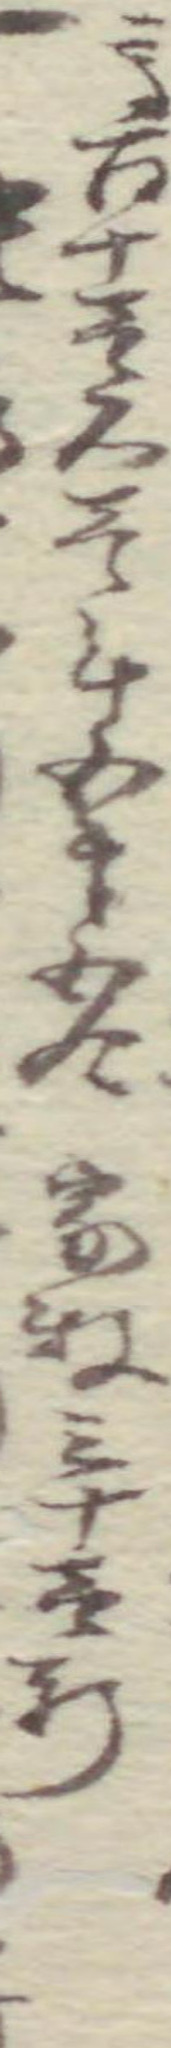高百十壱石壱斗五升五合家数三十壱軒
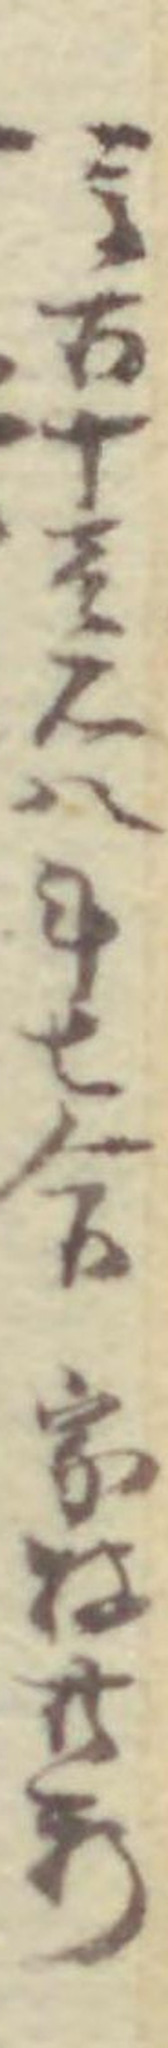高百十壱石八斗七合家数廿軒
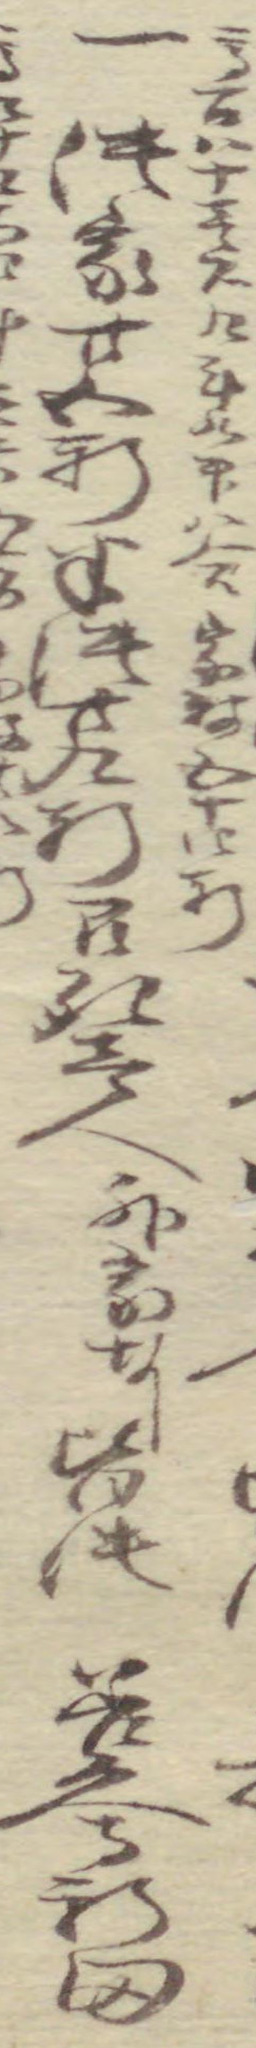一潰家廿五軒半潰廿九軒即死壱人外家なし皆潰善久寺新田
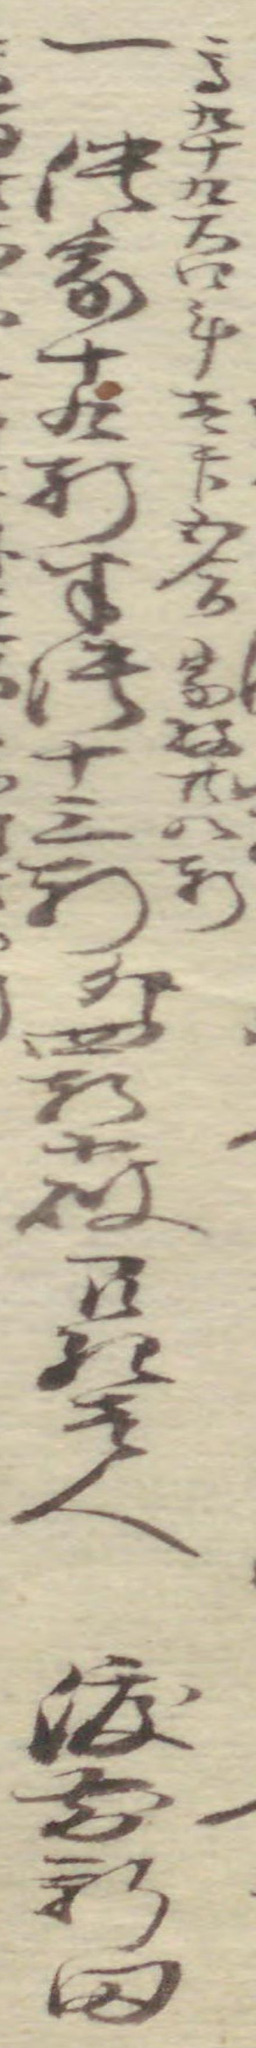一潰家十九軒半潰十三軒外四軒小破即死壱人渡前新田
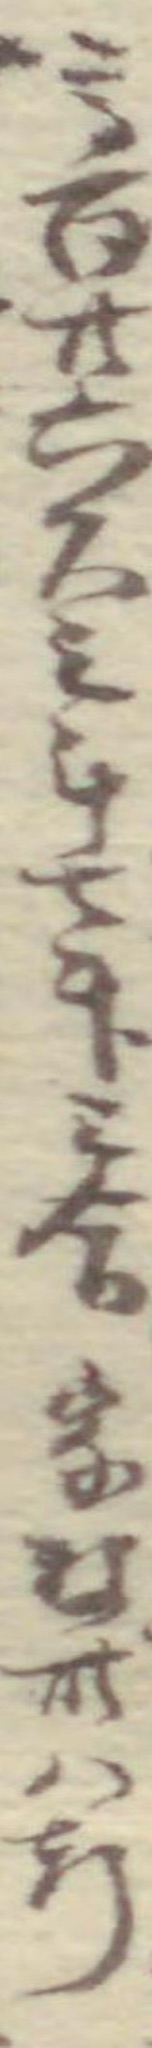高百廿六石三斗七升三合家数卅八軒
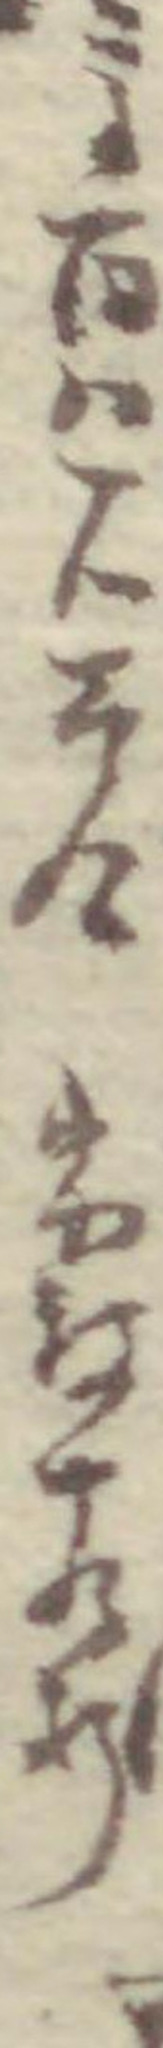高百八石壱合家数十九軒
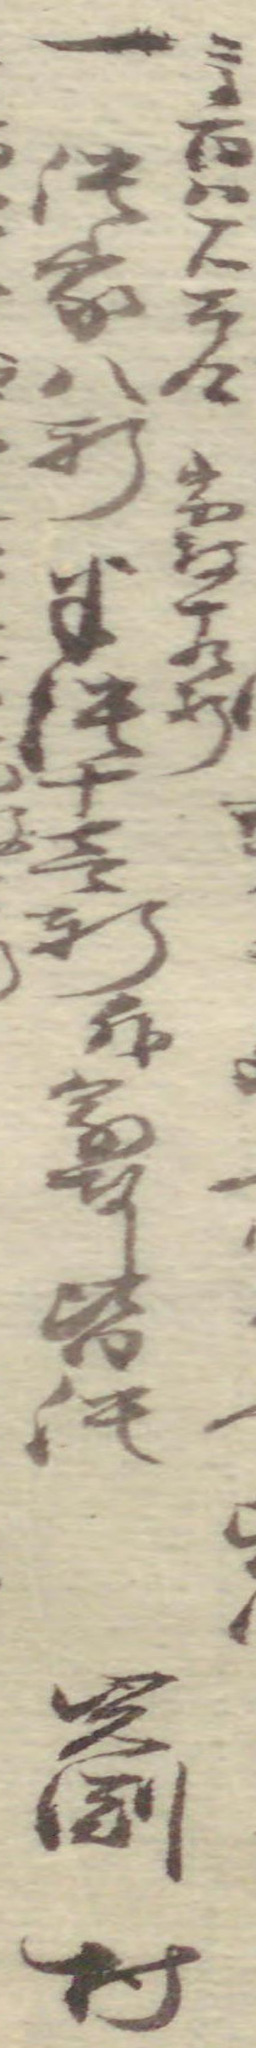一潰家八軒半潰十壱軒外家なし皆潰岩淵村
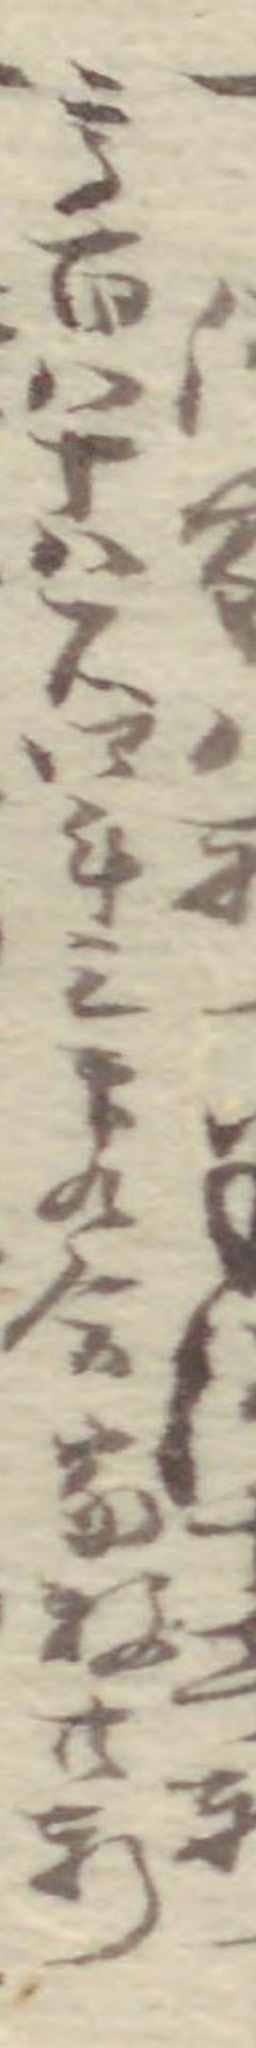高百八十八石四斗三升九合家数廿軒
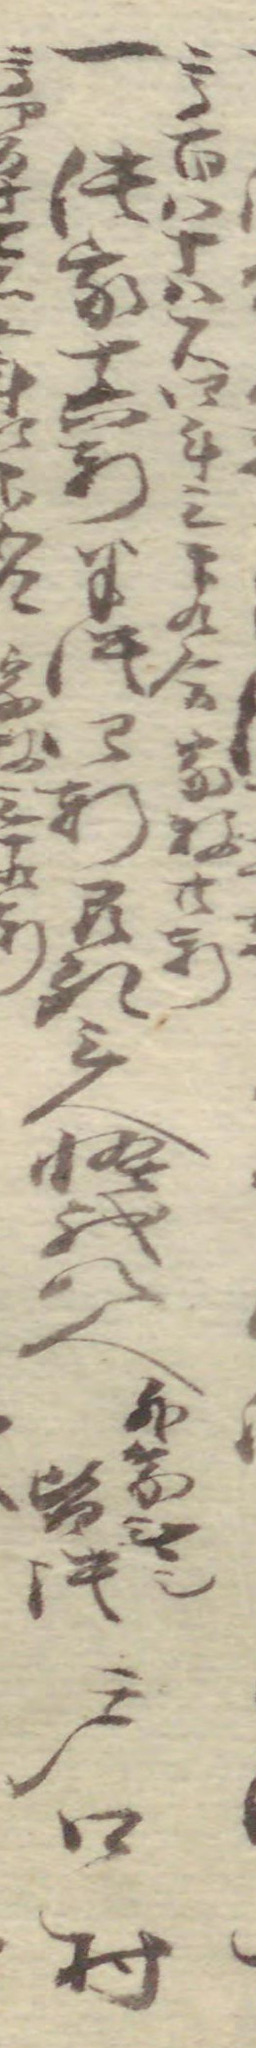一潰家十六軒半潰四軒即死三人怪我八人外家無シ皆潰戸口村
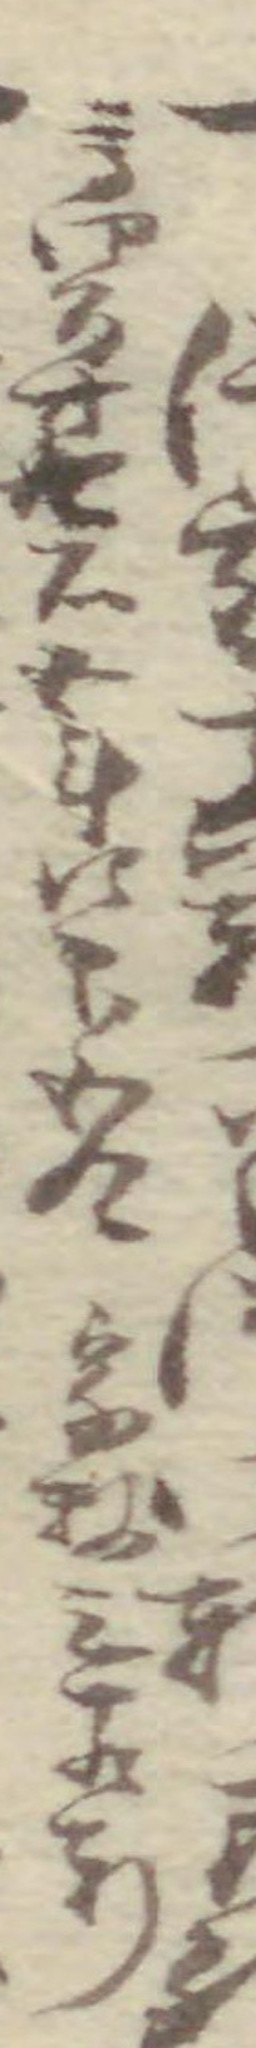高四百廿四石五斗四升五合家数三十九軒
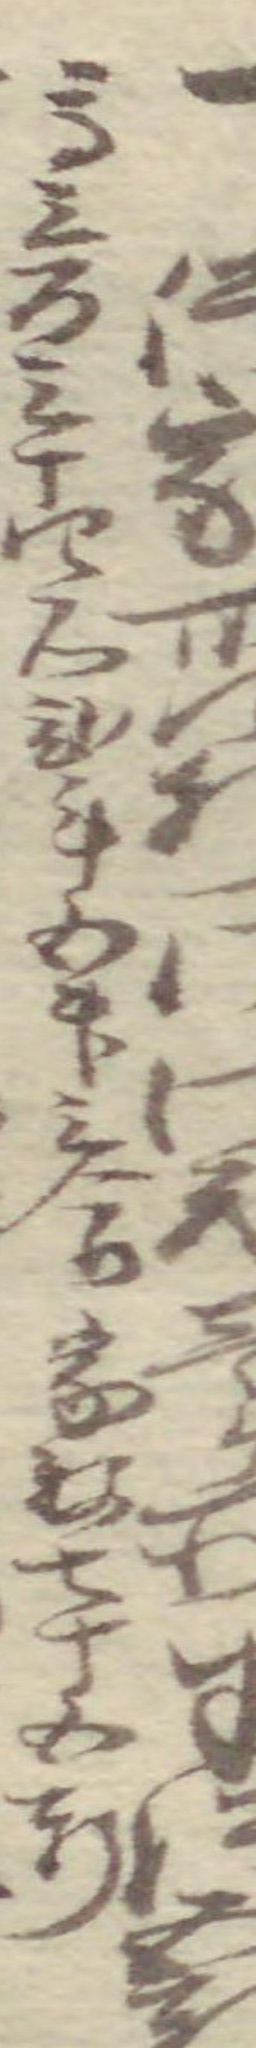高三百三十四石弐斗五升三合家数七十五軒
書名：鶯宿雑記. 巻199-200
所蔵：国立国会図書館 National Diet Library, JAPAN
